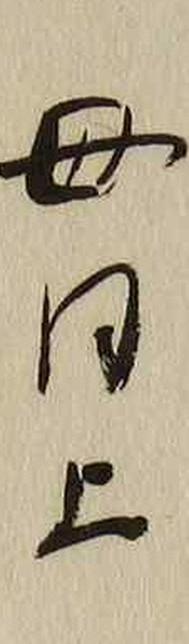母同上
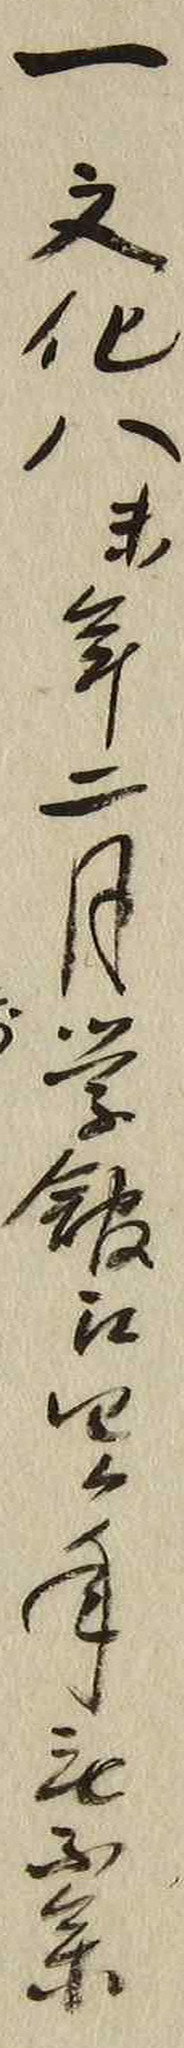一文化八未年二月学館江四ヶ年無不参
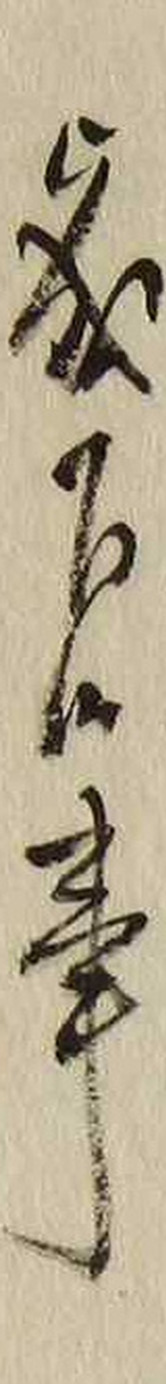被成下候事
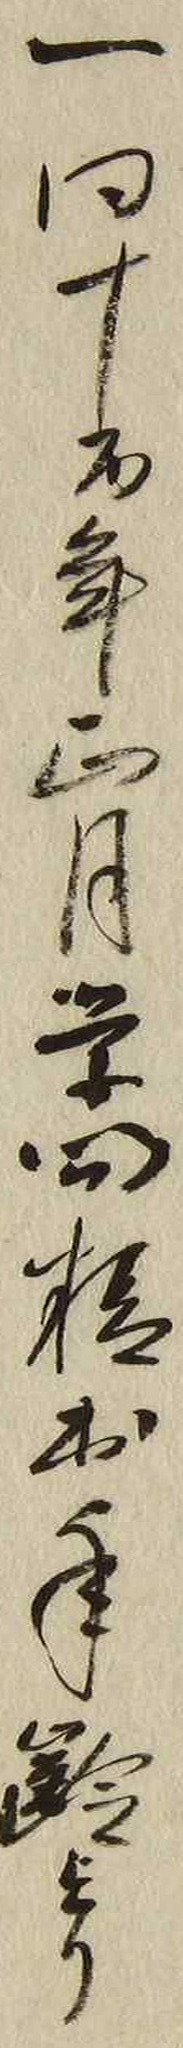一同十酉年正月学問精出年齢より
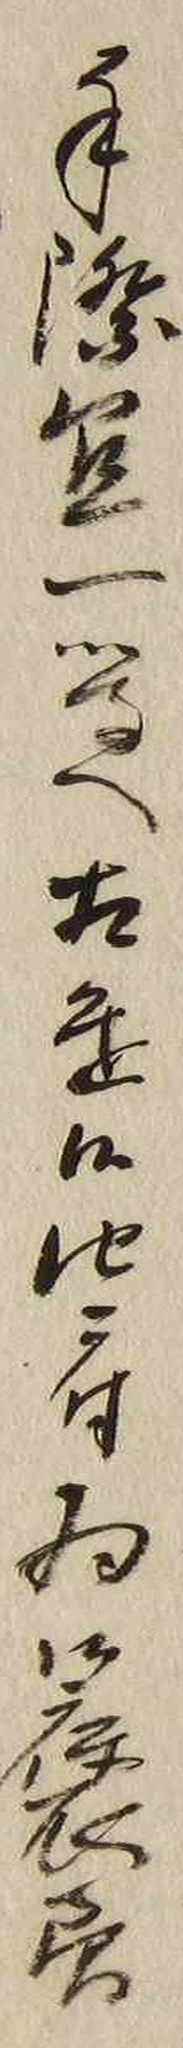手際宜一等へ相進候ニ付為御褒美
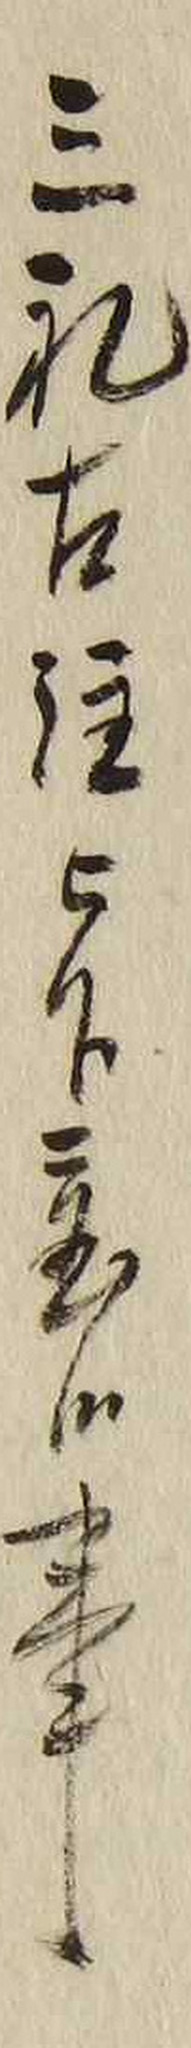三礼古注被下置候事

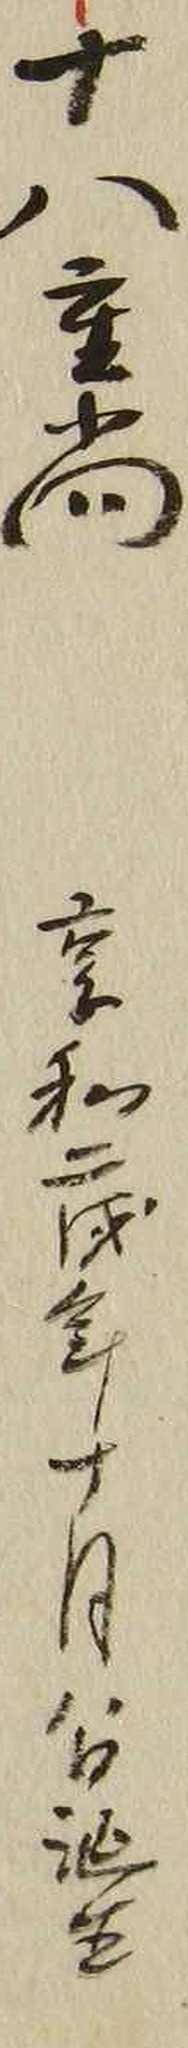十八重尚享和二戊年十月八日誕生
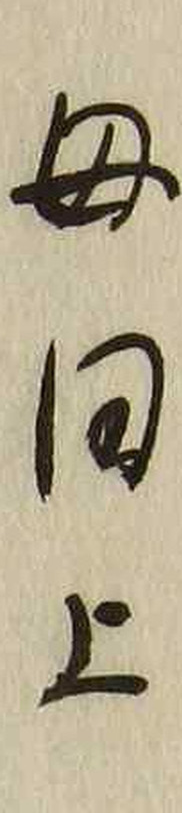母同上
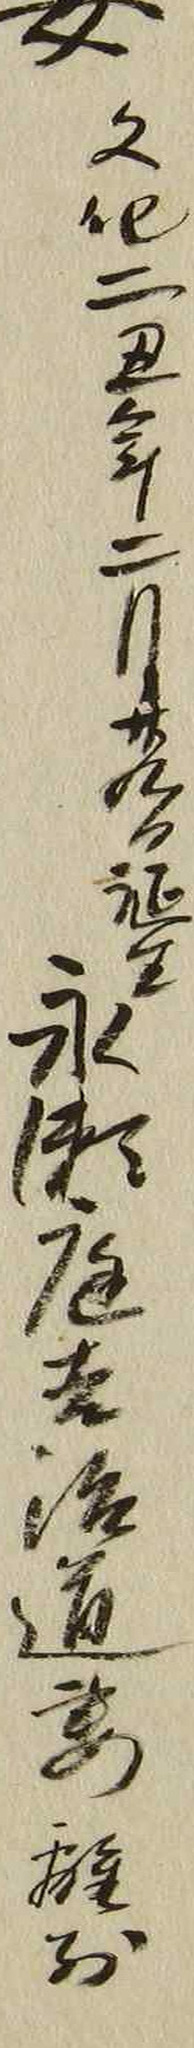女文化二丑年二月廿九日誕生永瀬庭吉治道妻離別
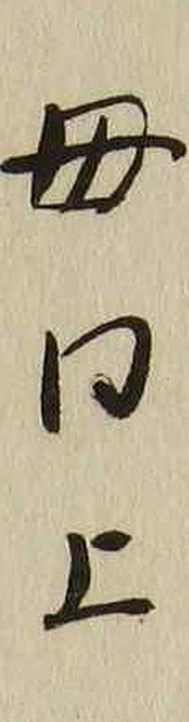母同上
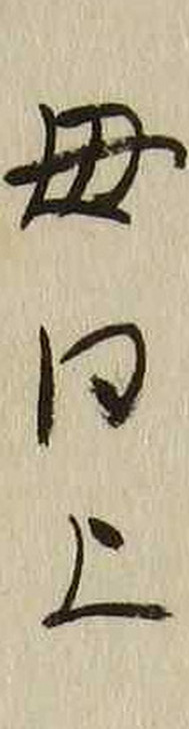母同上
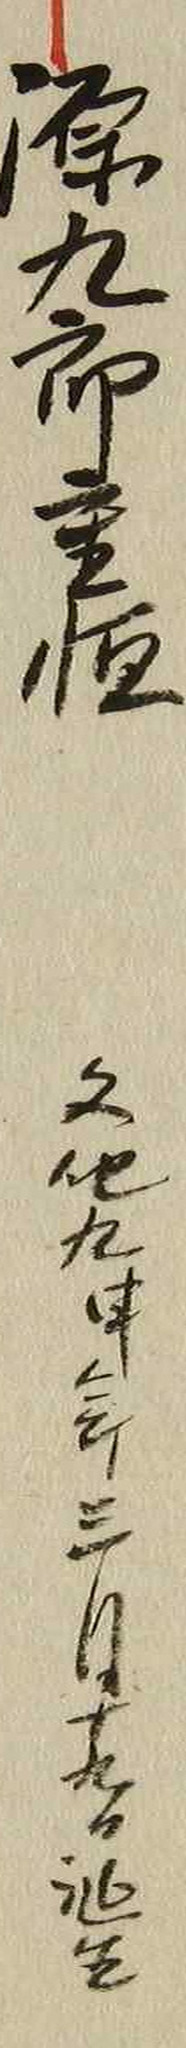源九郎重恒文化九申年三月十九日誕生
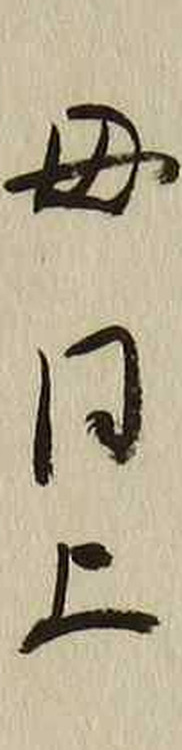母同上
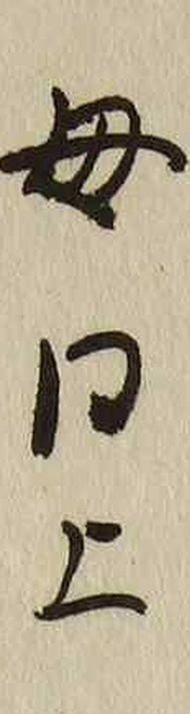母同上

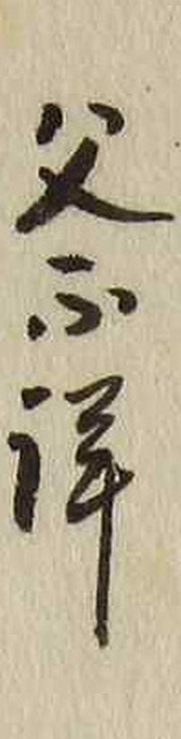父不詳
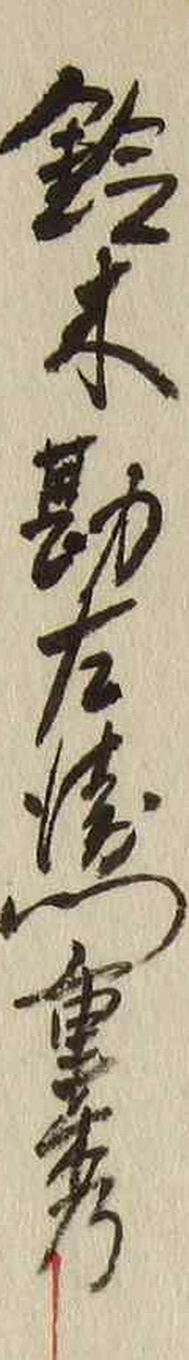鈴木勘左衛門重秀
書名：諸士系譜　巻之360　す之部10
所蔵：会津若松市立会津図書館
